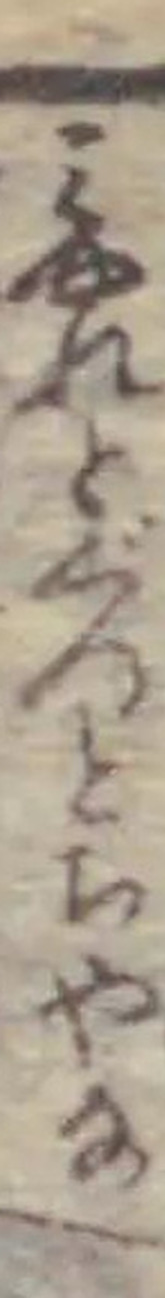みやれとぐつとちやな
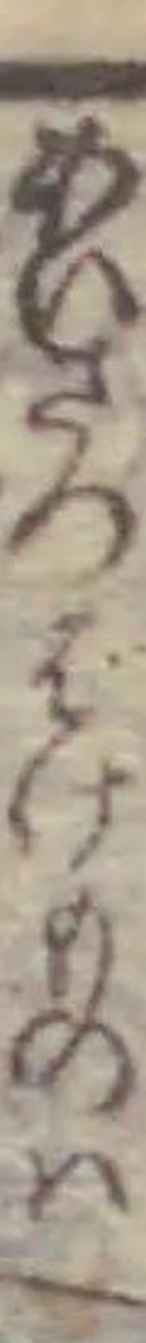あいさつばけものは
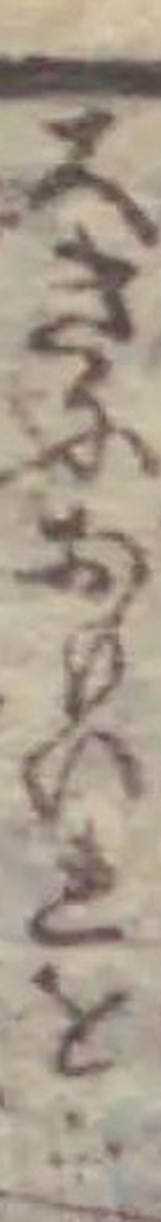大きにおもいれを
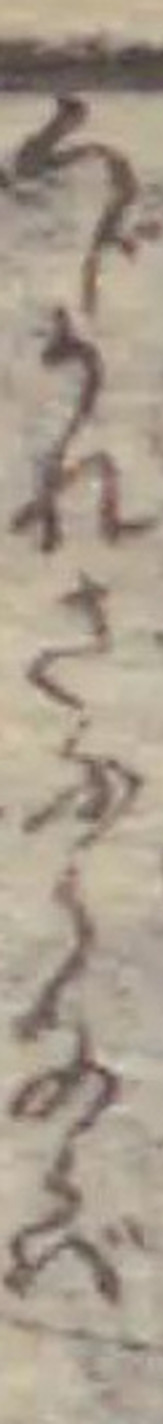くじかれさふかならば
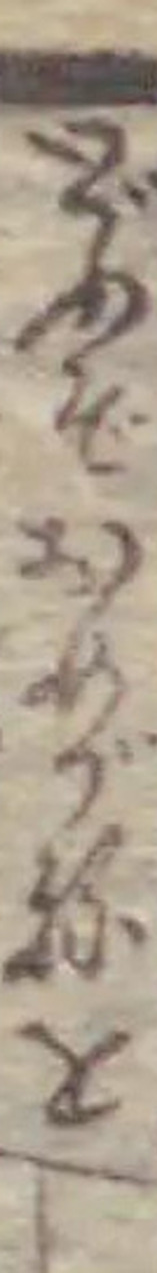どふぞおめがねを
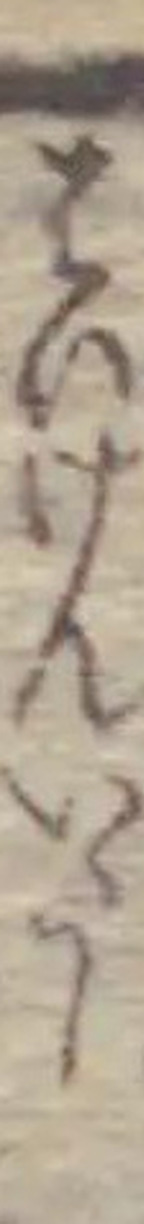はいけんいたし
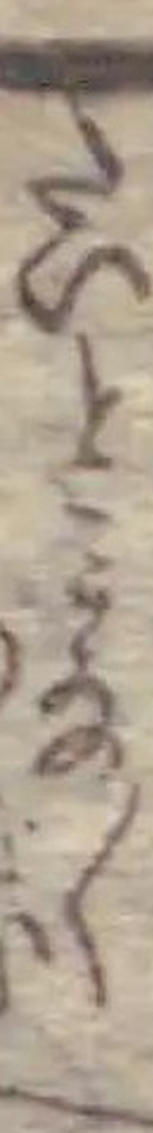たいとみな〳〵

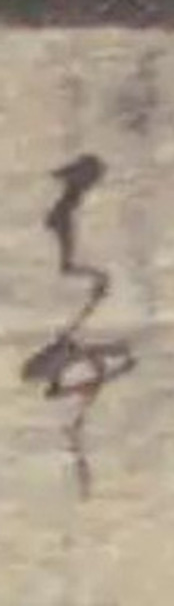はやく
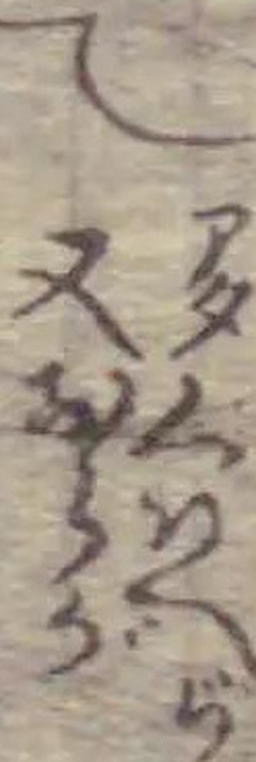又おらが
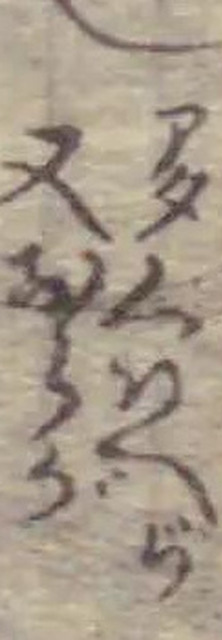又おらが
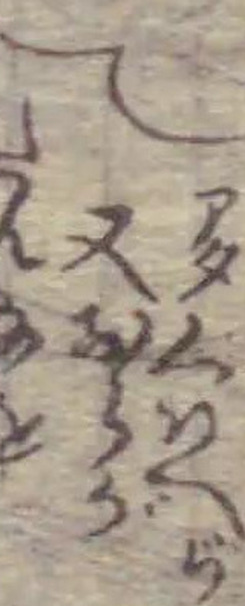たんなを
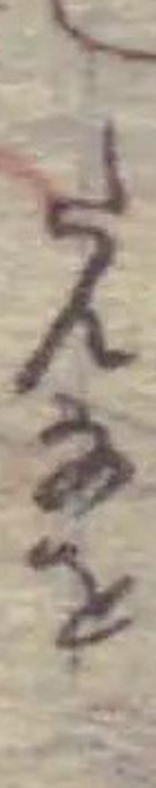たんなを
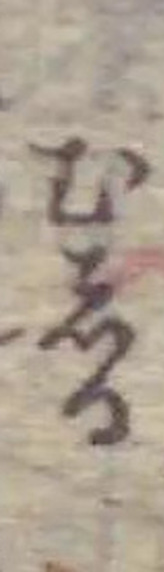むしる
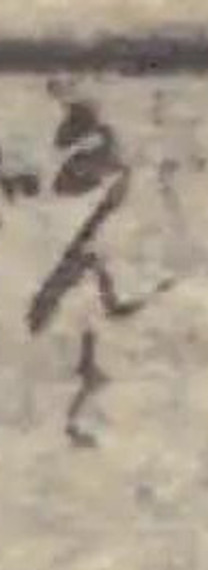なんと
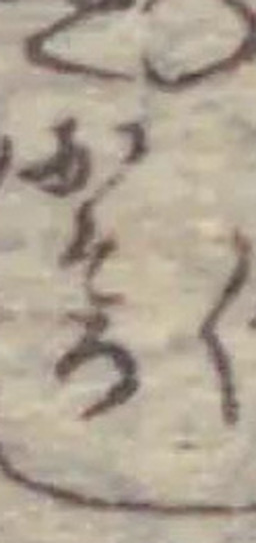おそろ
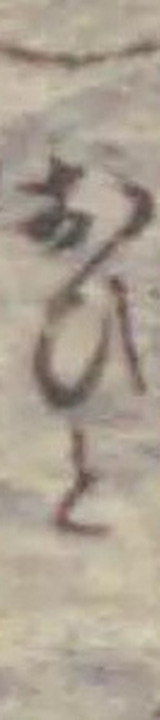おひと
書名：化物大閉口 2巻
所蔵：国立国会図書館 National Diet Library, JAPAN
